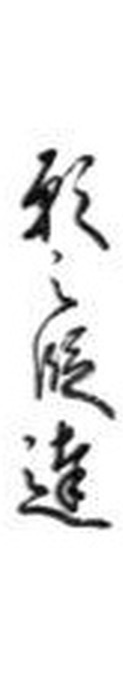願之通達
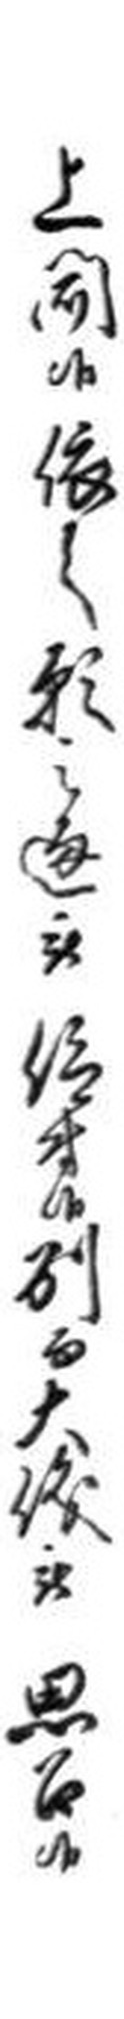上聞候依之願之通被仰付候別而大儀被思召候
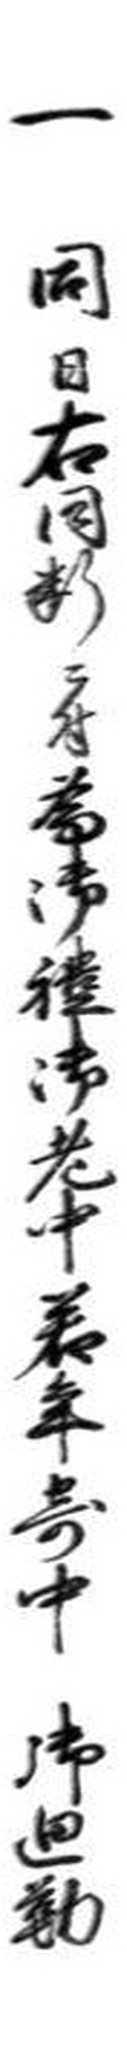一同日右同断ニ付為御礼御老中若年寄中御廻勤
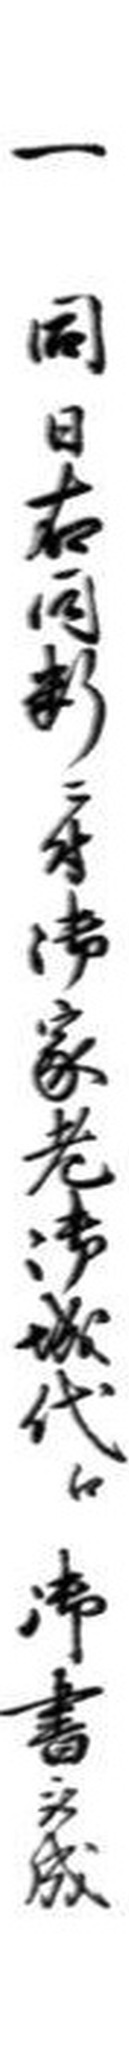一同日右同断ニ付御家老御城代江御書被成
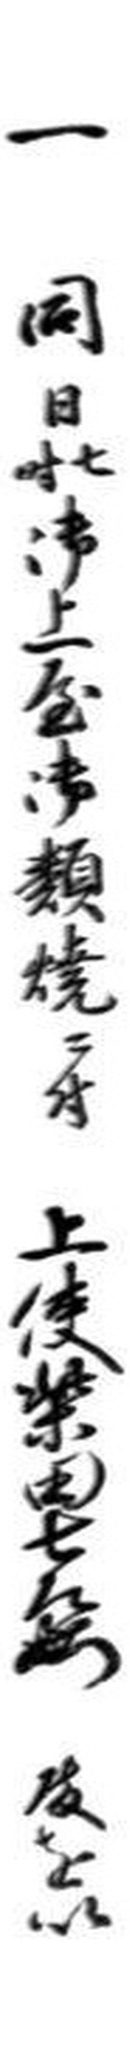時御上屋敷御類焼ニ付上使柴田七左衛門殿を以
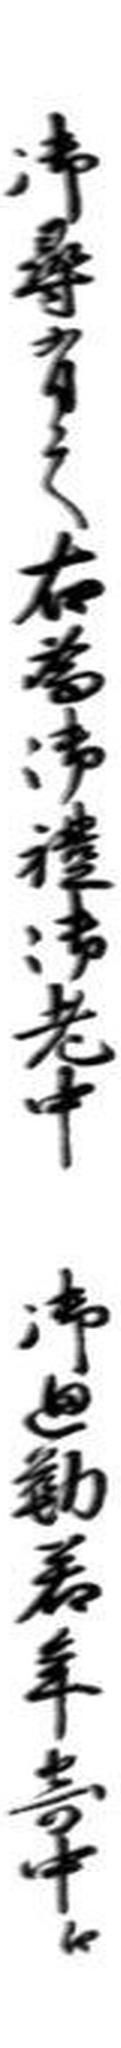御尋有之右為御礼御老中御廻勤若年寄中江
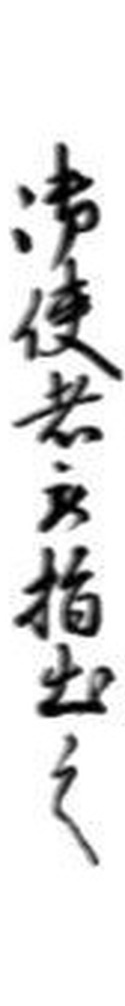御使者被指出之
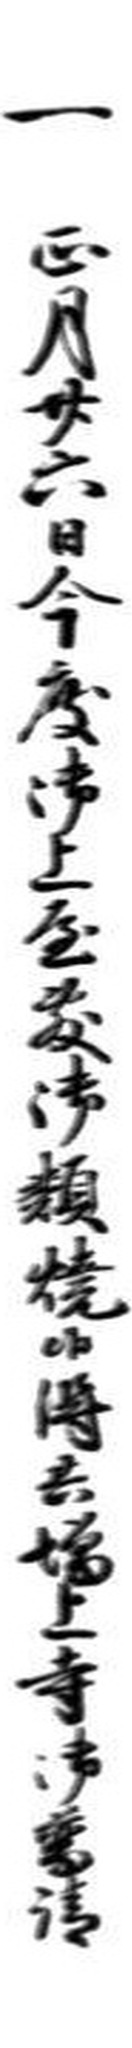一正月廿六日今度御上屋敷御類焼候得共増上寺御普請
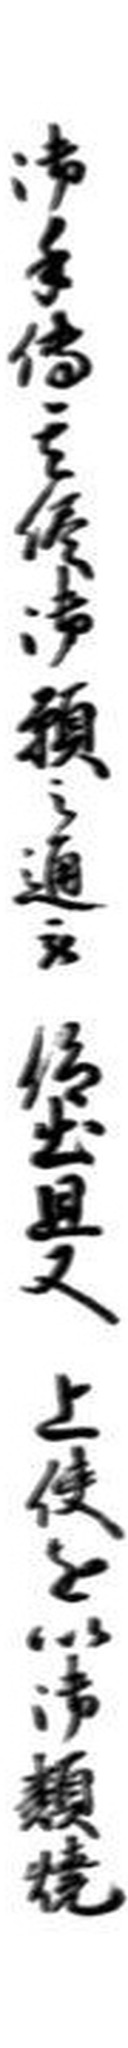御手伝其儘御願之通被仰出且又上使を以御類焼
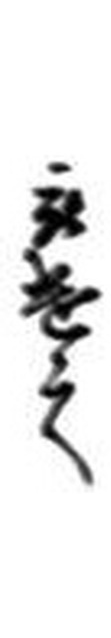被遣之
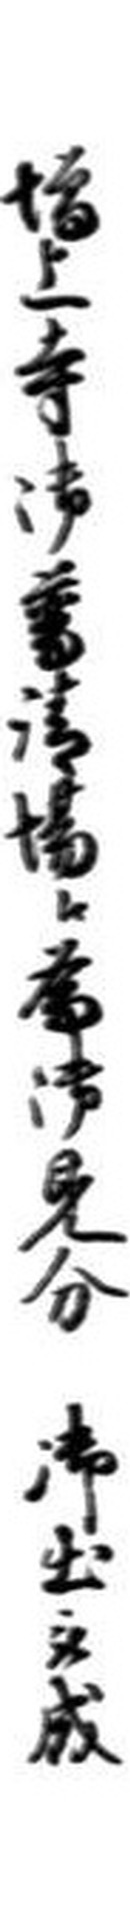増上寺御普請場江為御見分御出被成
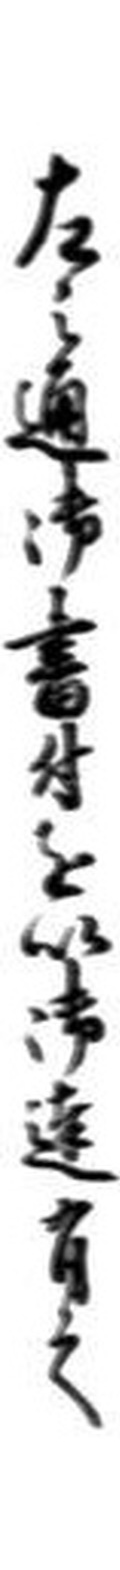左之通御書付を以御達有之

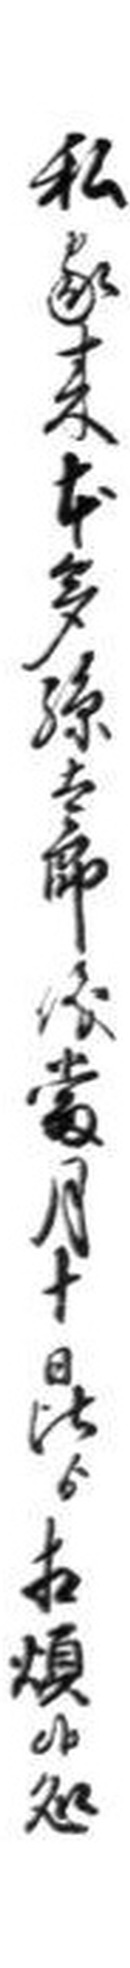私家来本多孫太郎儀当月十日頃ゟ相煩候処
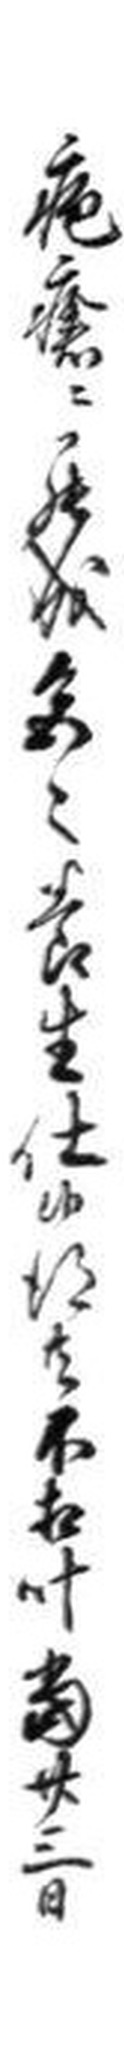疱瘡ニ罷成色々養生仕候得共不相叶当廿三日
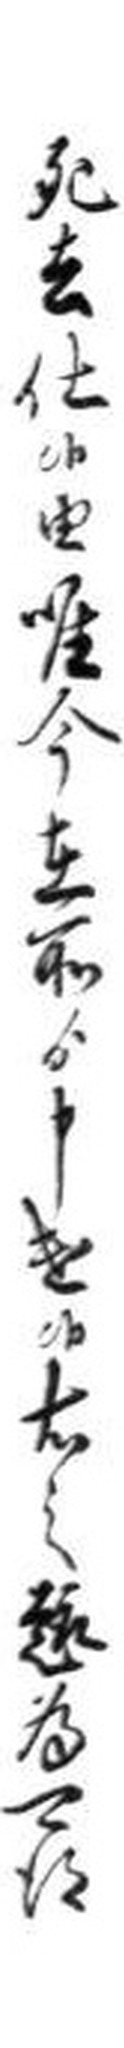死去仕候由唯今在所ゟ申遣候右之趣為可得
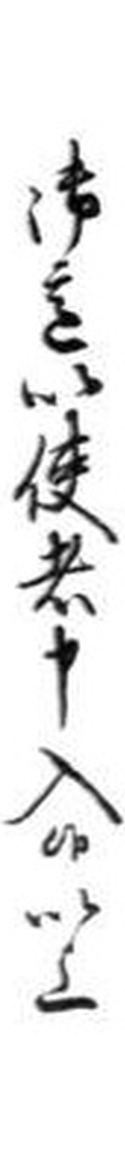御意以使者申入候以上
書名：家譜 三十二 吉邦公 従享保二年到享保三年
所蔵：福井県文書館 Fukui Prefectural Archives
